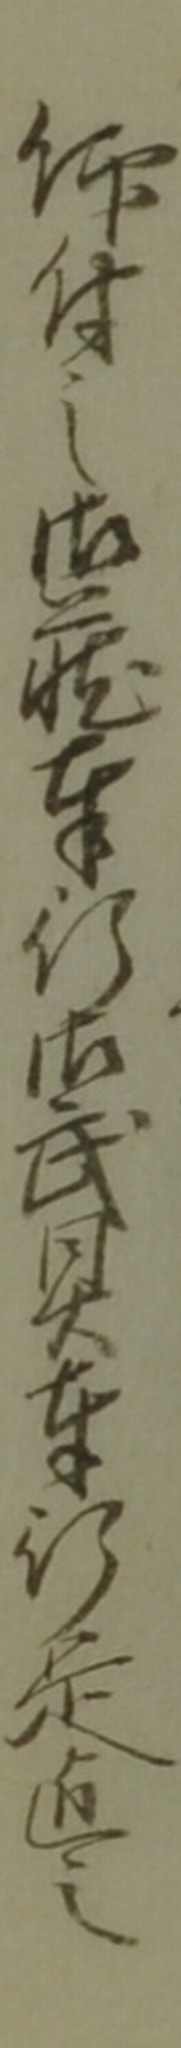仰付之御蔵奉行御武具奉行是迄之
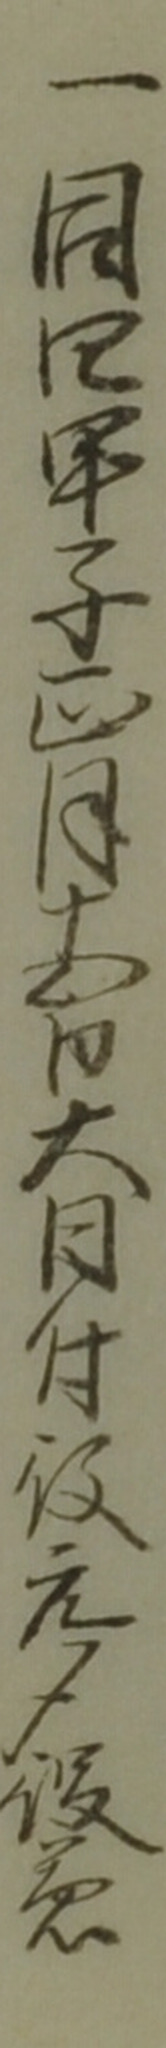一同四甲子正月十五日大目付役元〆役兼
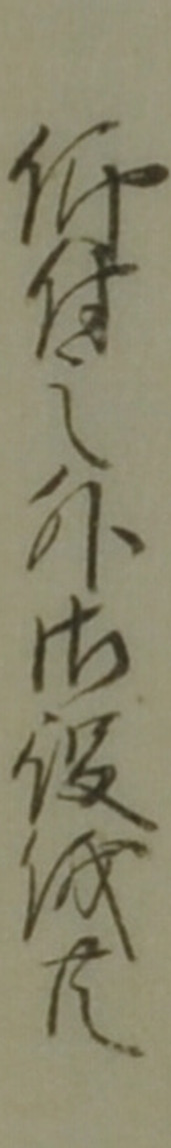帯被仰付之外御役儀共
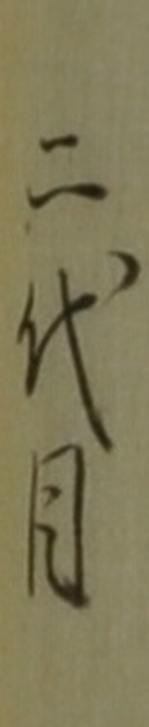二代目
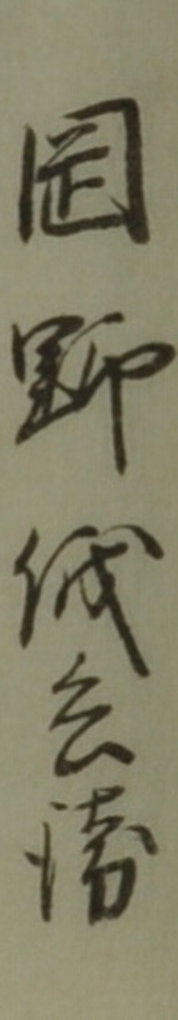岡野儀兵衛
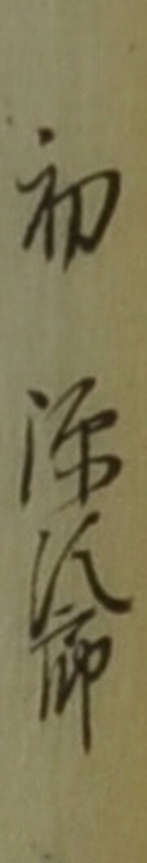初源次郎
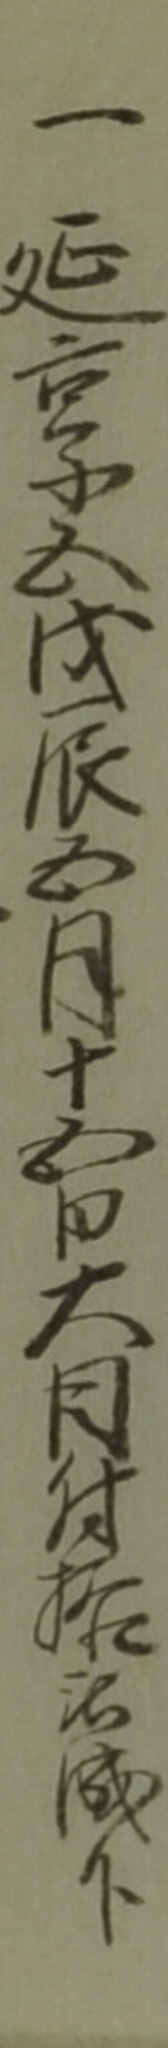一延享五戊辰五月十五日大目付格被成下
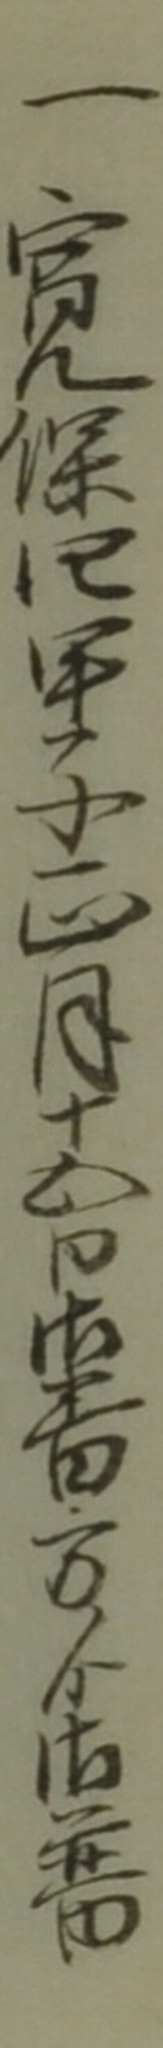一寛保四甲子正月十五日御番方ゟ御普
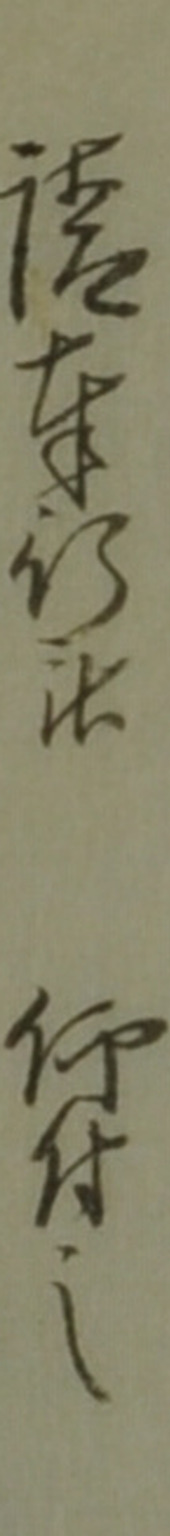請奉行被仰付之
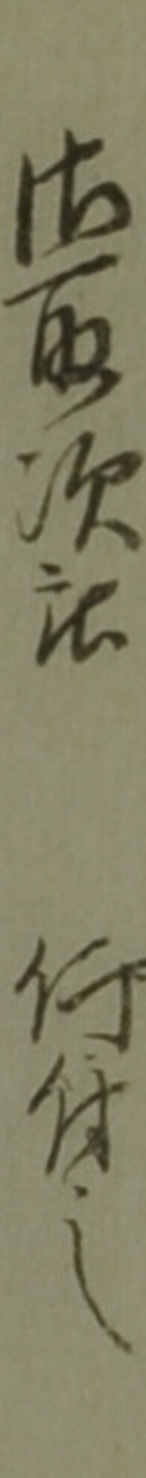御取次被仰付之
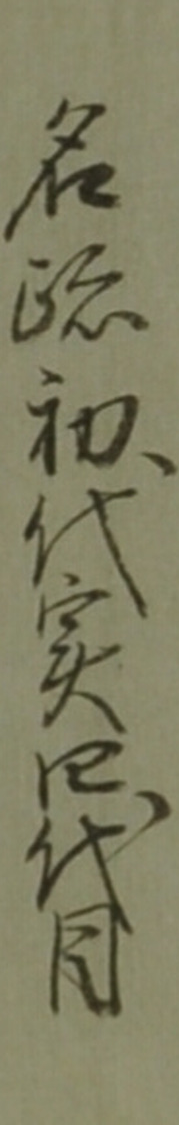名跡初代実四代目
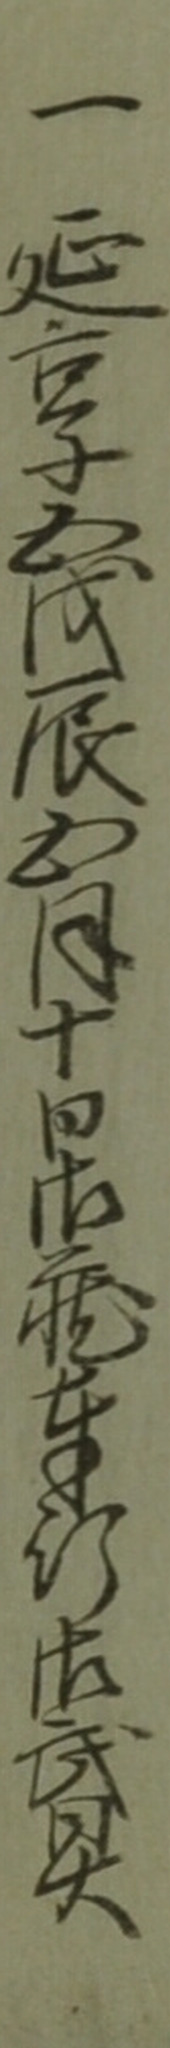一延享五戊辰五月十日御蔵奉行御武具
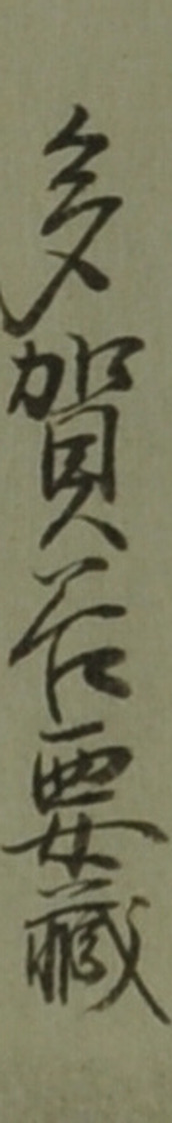多賀谷要蔵
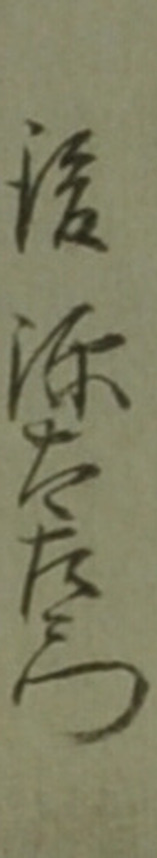後源太左衛門
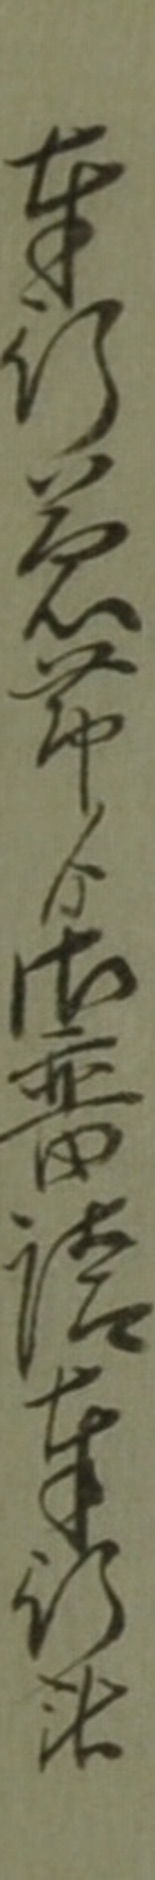奉行兼帯ゟ御普請奉行被
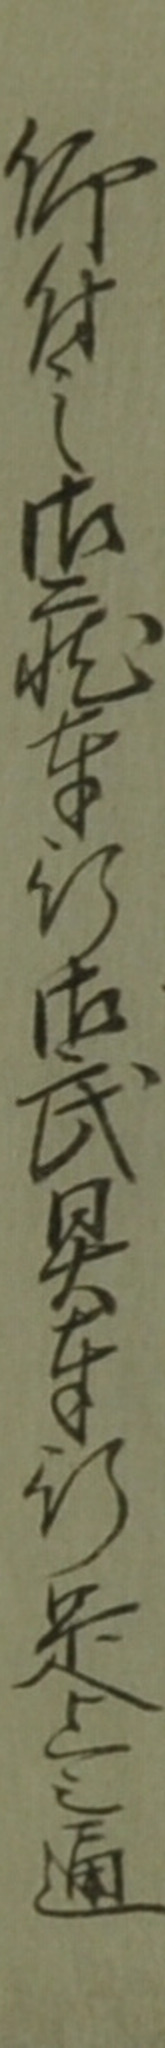仰付之御蔵奉行御武具奉行是迄之通
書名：諸御役代々録（六）
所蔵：伊那市立高遠町図書館・合同会社AMANE
